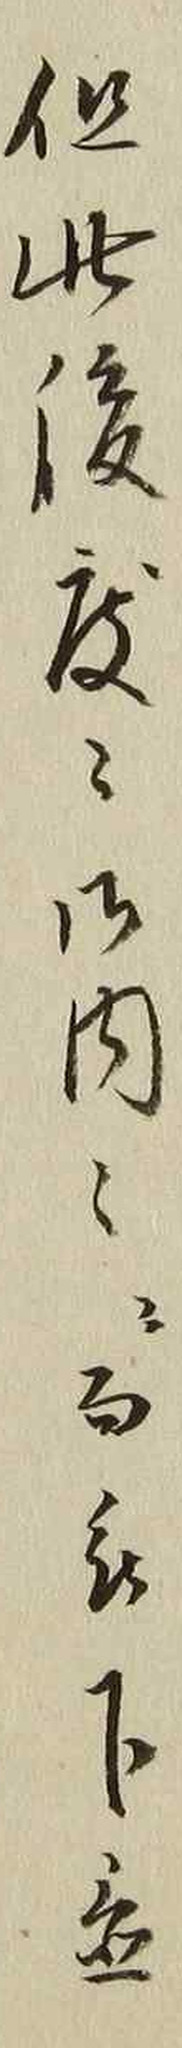但此後度々御内々ニ而被下置
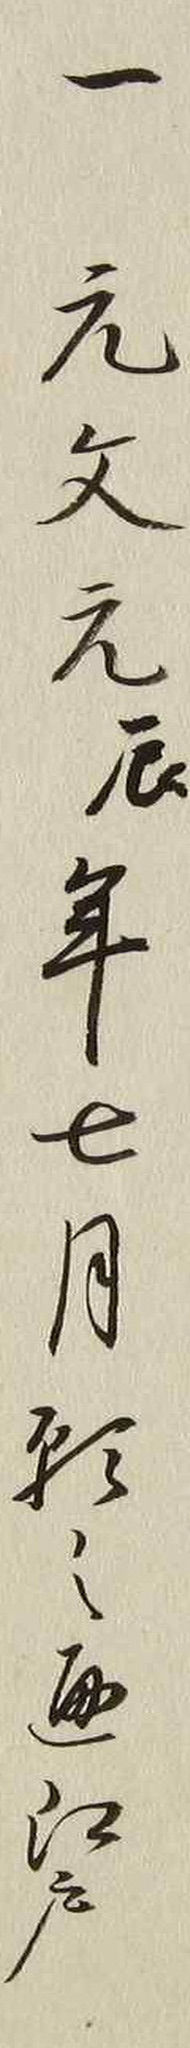一元文元辰年七月願之通江戸
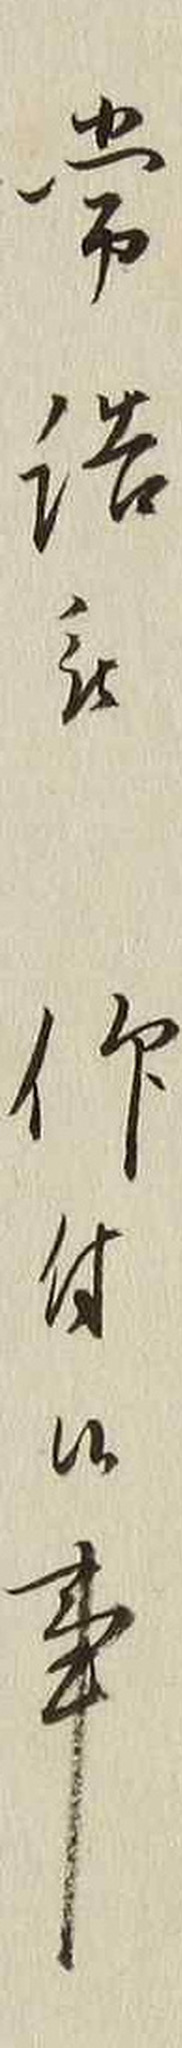常詰被仰付候事
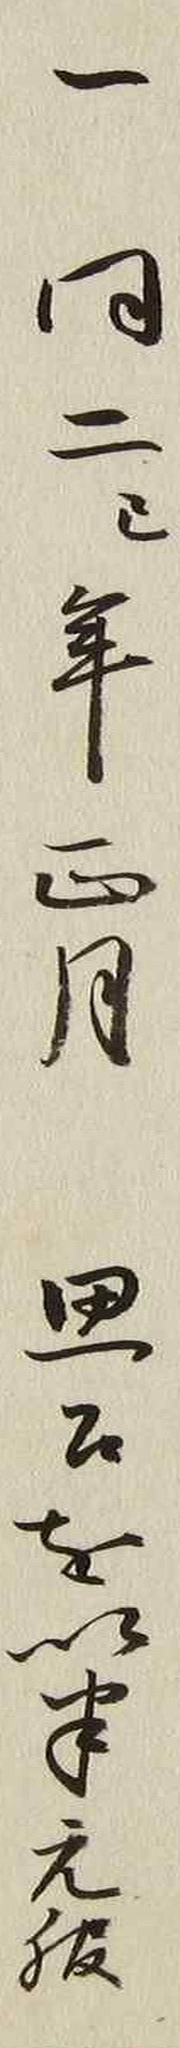一同二巳年正月思召を以半元服
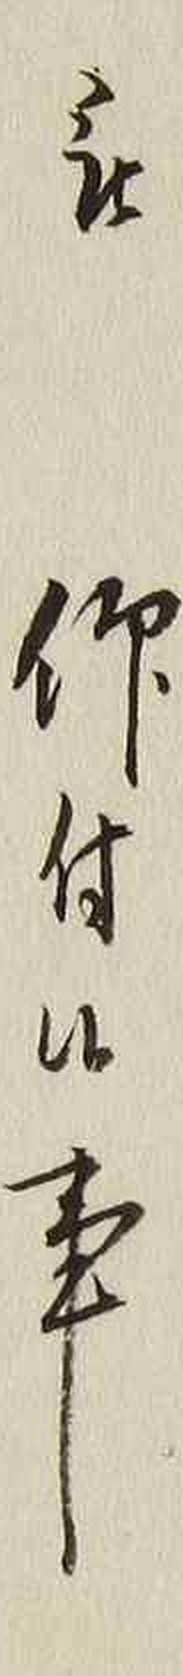被仰付候事
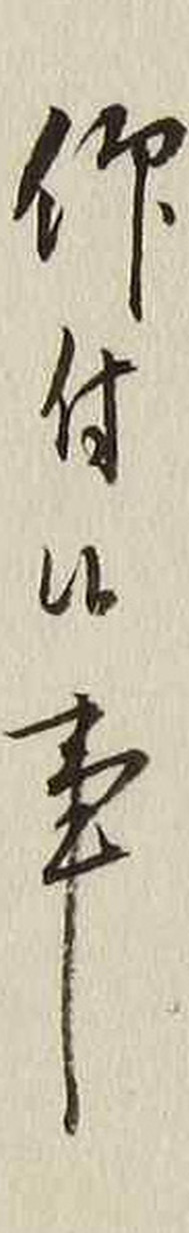仰付候事
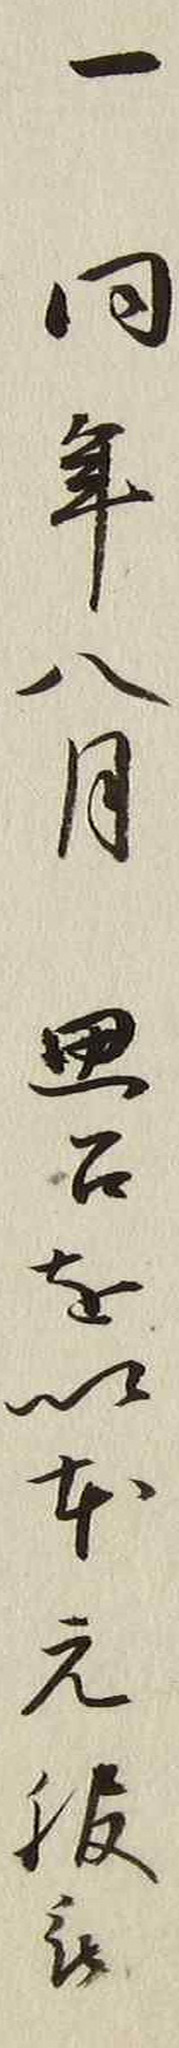一同年八月思召を以本元服被
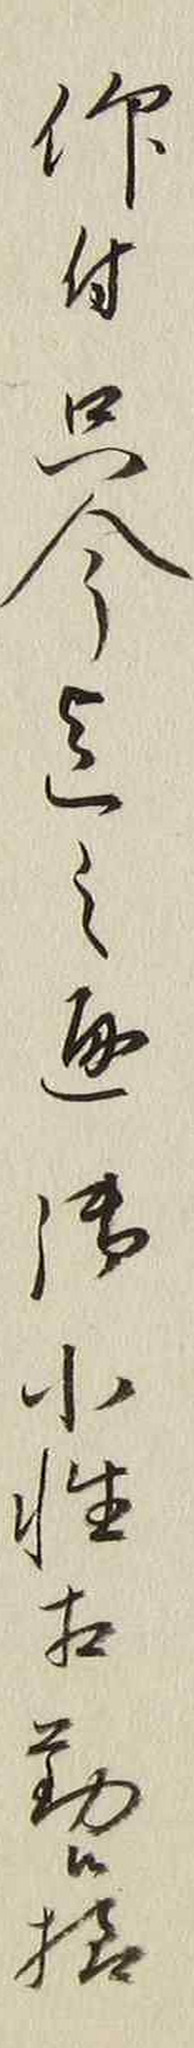仰付只今迄之通御小性相勤候様
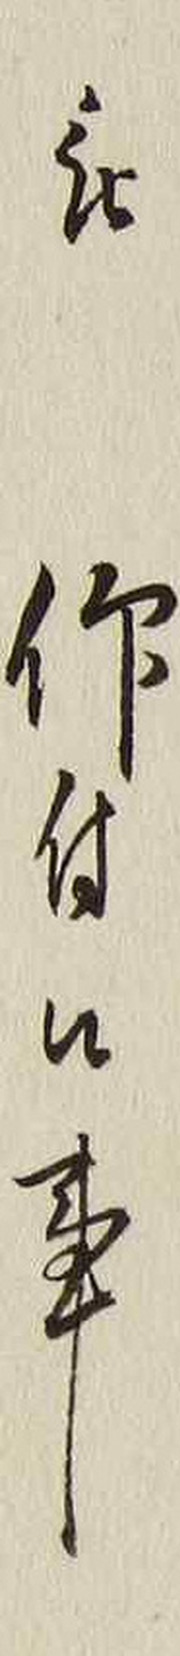被仰付候事
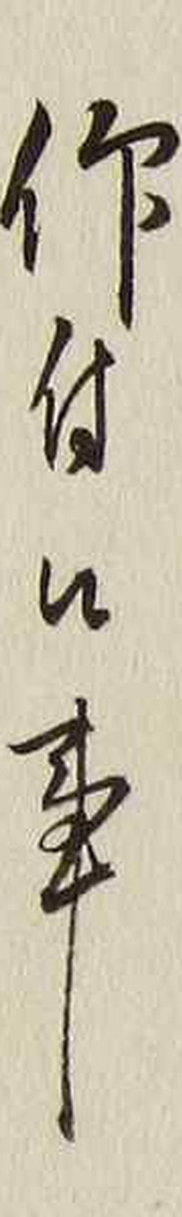仰付候事
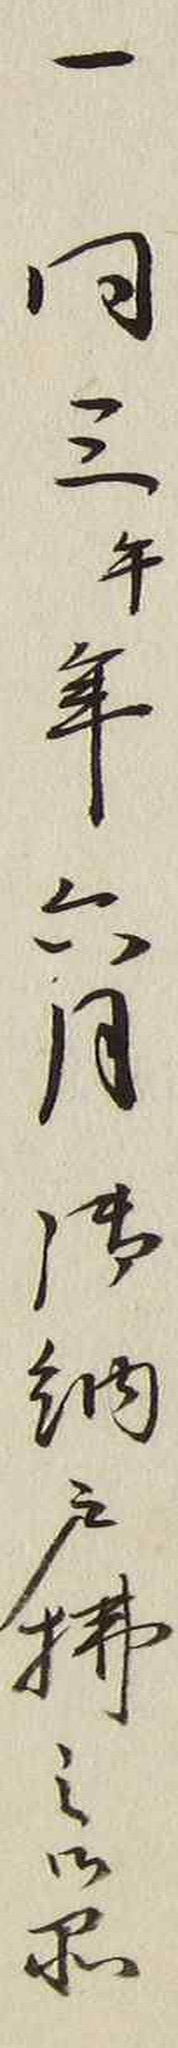一同三午年六月御納戸払之御品
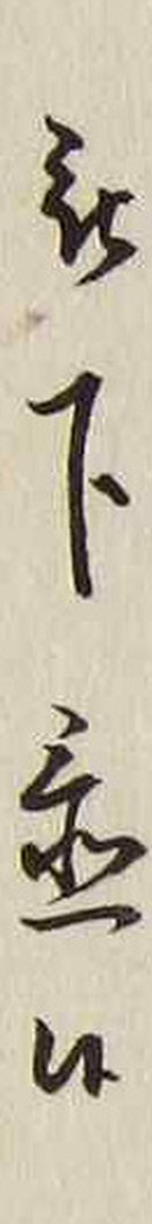被下置候

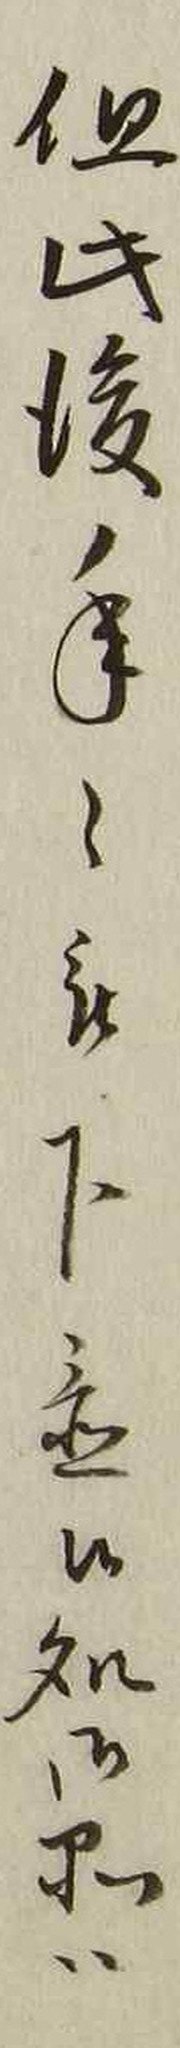但此後年々被下置候処御品ハ
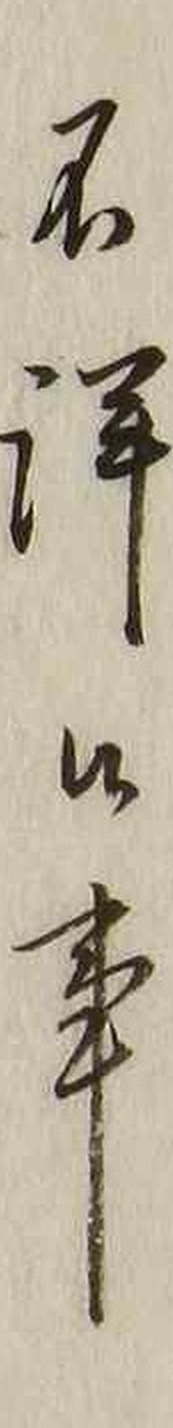不詳候事
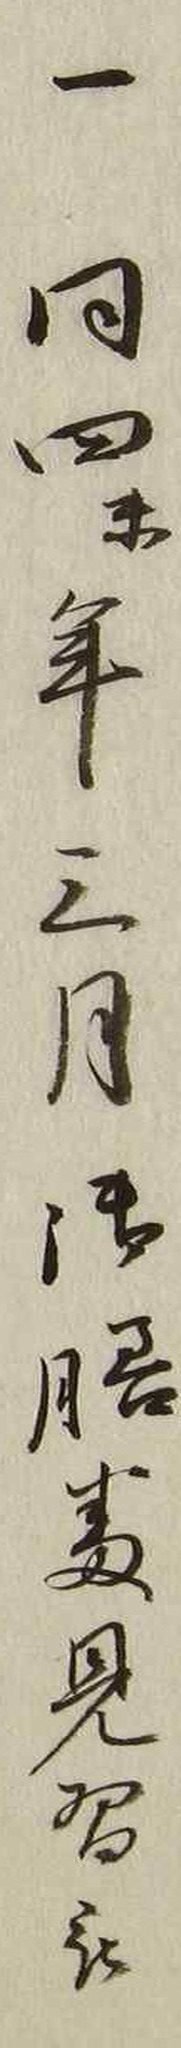一同四末年三月御膳番見習被
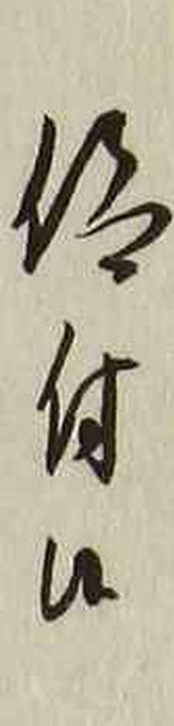仰付候
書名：諸士系譜　巻之22　い之部22
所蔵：会津若松市立会津図書館
